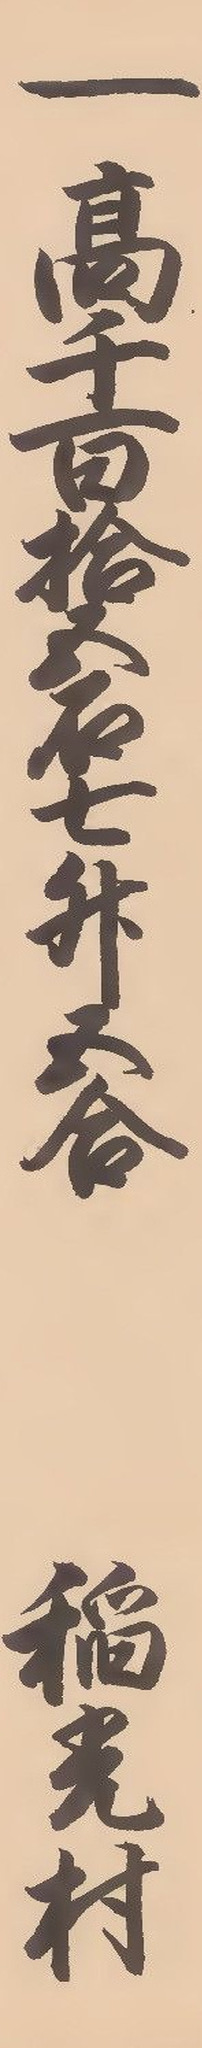一髙千百拾五石七升五合稲光村
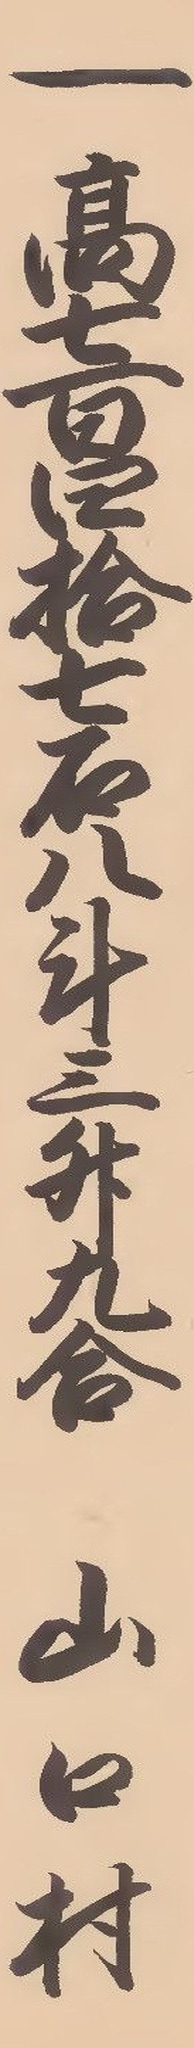一髙七百四拾七石八斗三升九合山口村
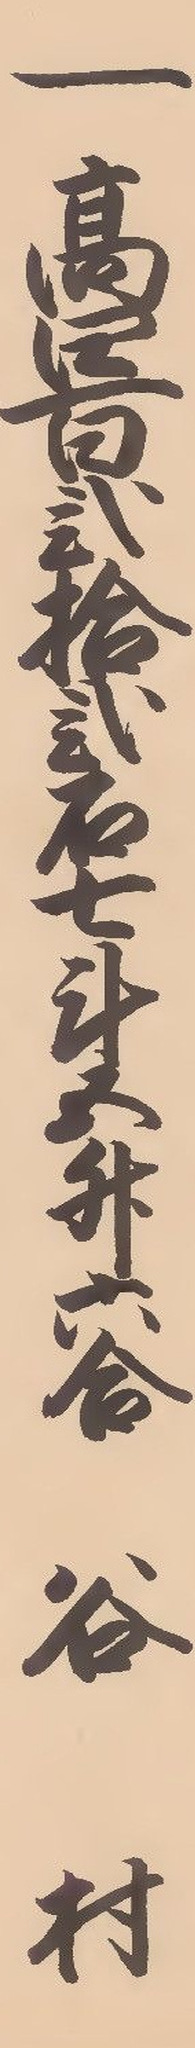一髙四百弐拾弐石七斗五升六合谷村
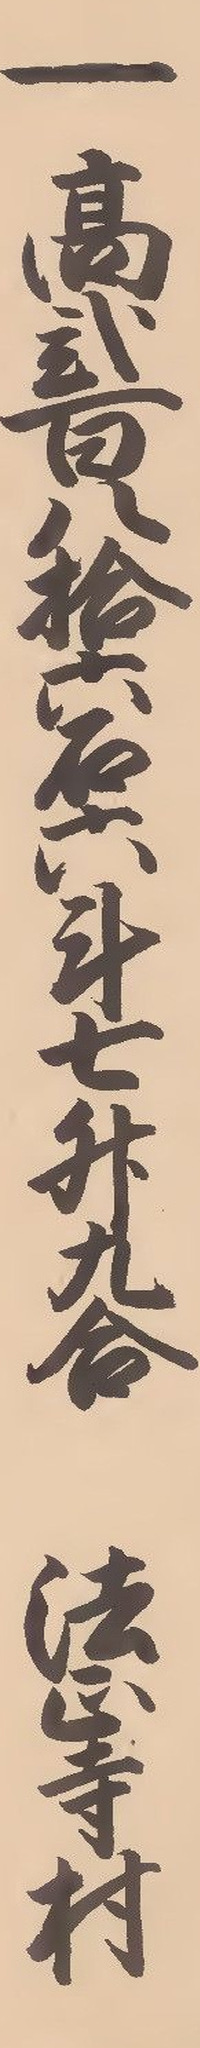一髙弐百八拾六石六斗七升九合法正寺村
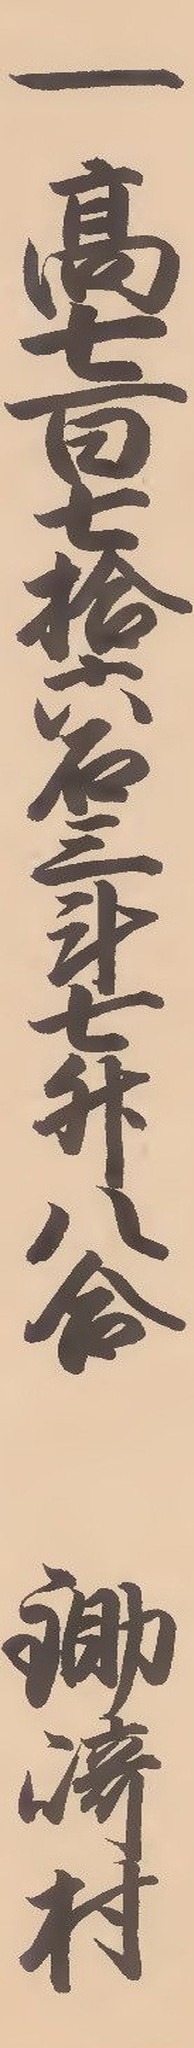一髙七百七拾六石三斗七升八合鋤崎村
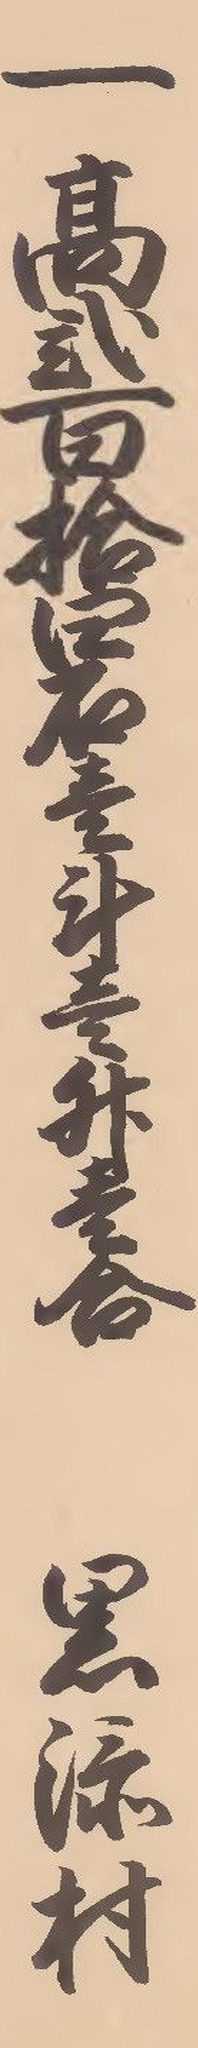一髙弐百拾四石壱斗壱升壱合黑添村
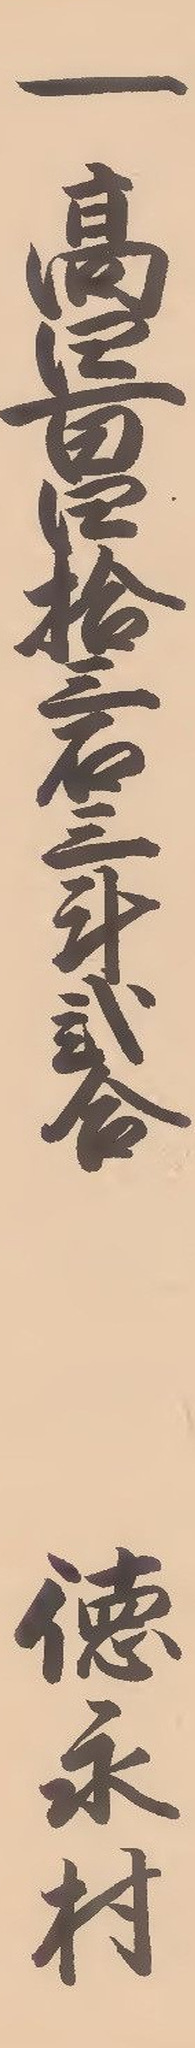一髙四百四拾三石三斗弐合徳永村

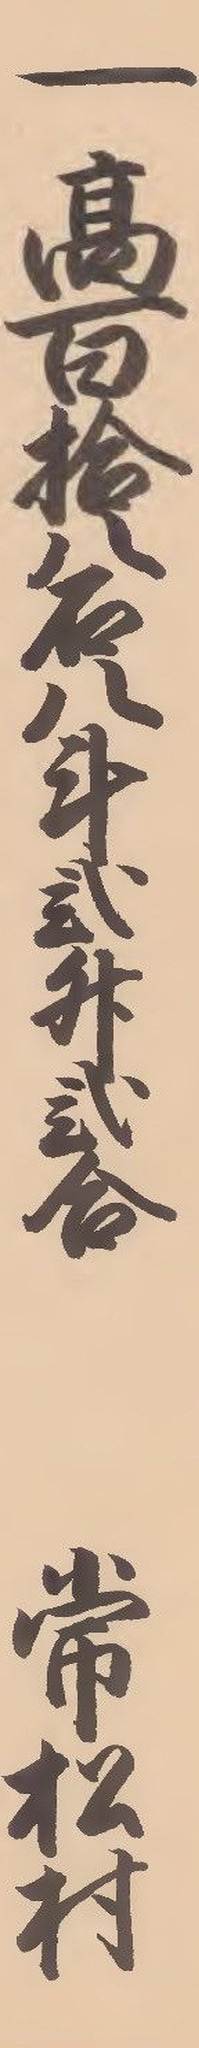一髙百拾八石八斗弐升弐合常松村
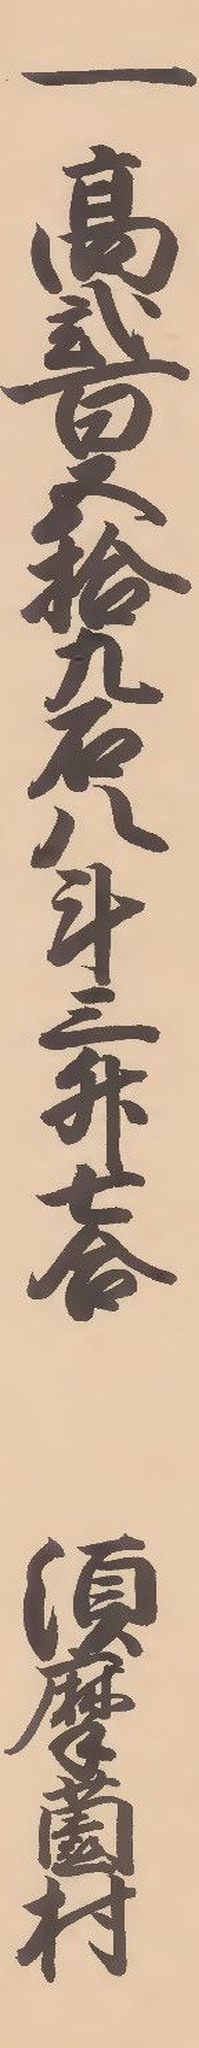一髙弐百五拾九石八斗三升七合須摩薗村
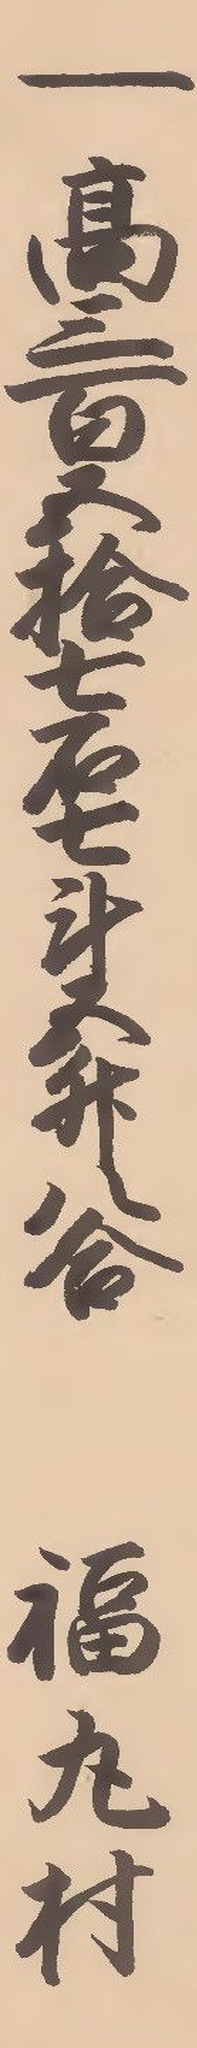一髙三百五拾七石七斗五升八合福丸村
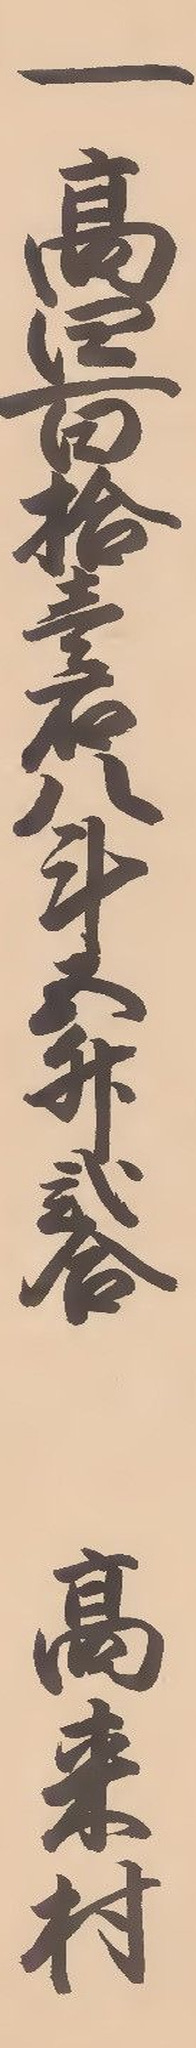一髙四百拾壱石八斗五升弐合髙来村
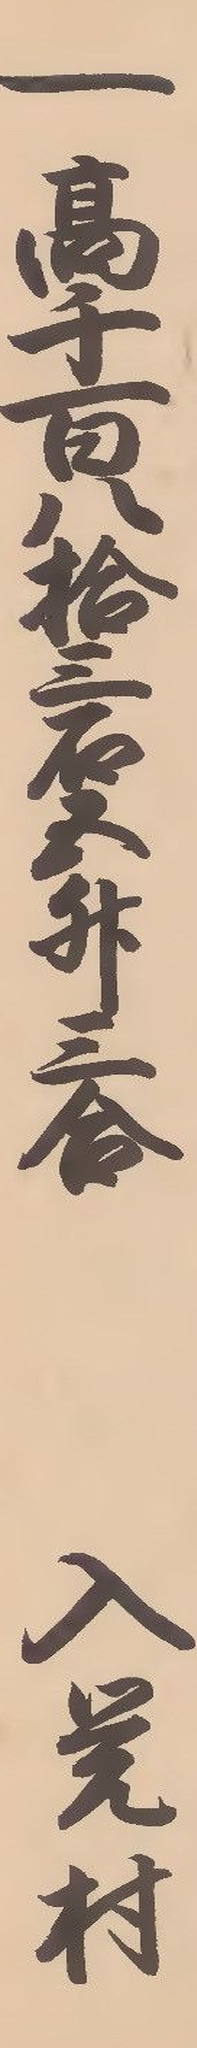一髙千百八拾三石五升三合入覺村
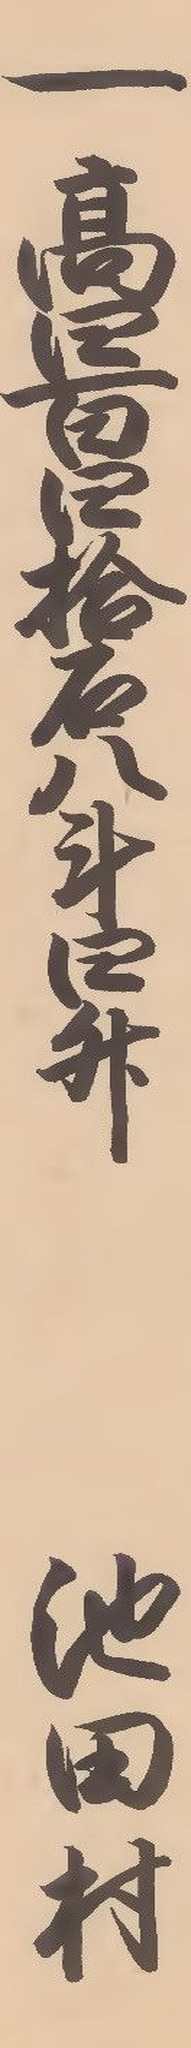一髙四百四拾石八斗四升池田村
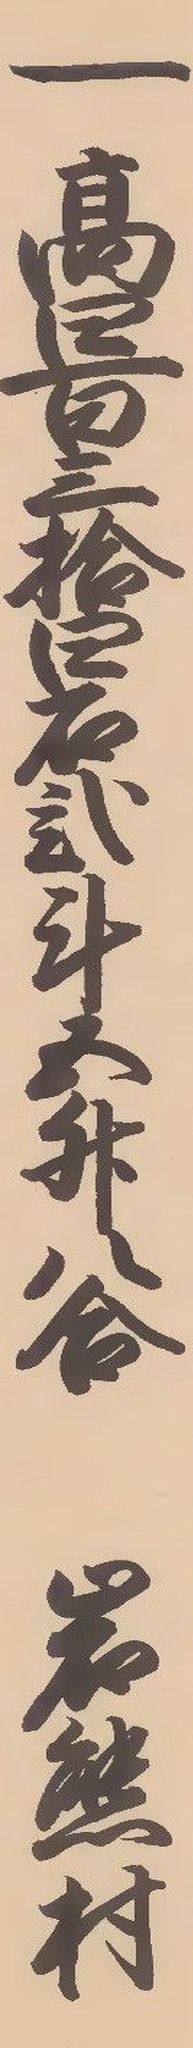一髙四百三拾四石弐斗五升八合岩熊村
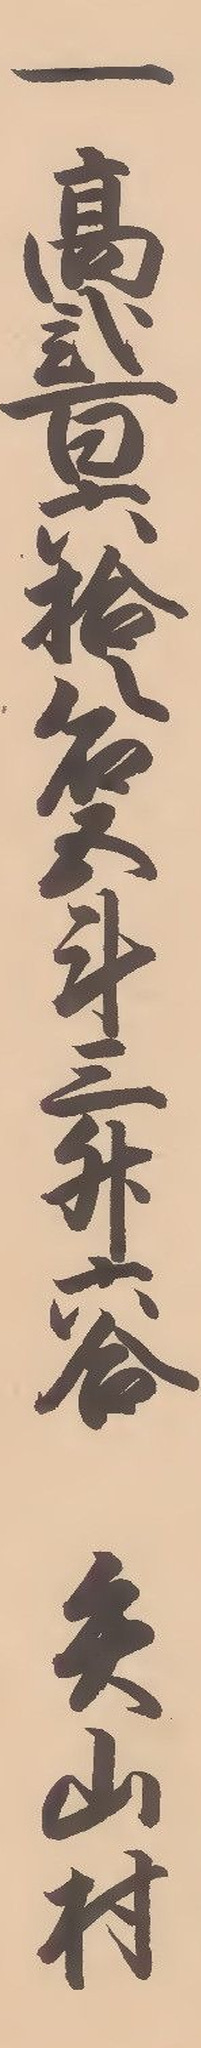一髙弐百六拾八石五斗三升六合矢山村

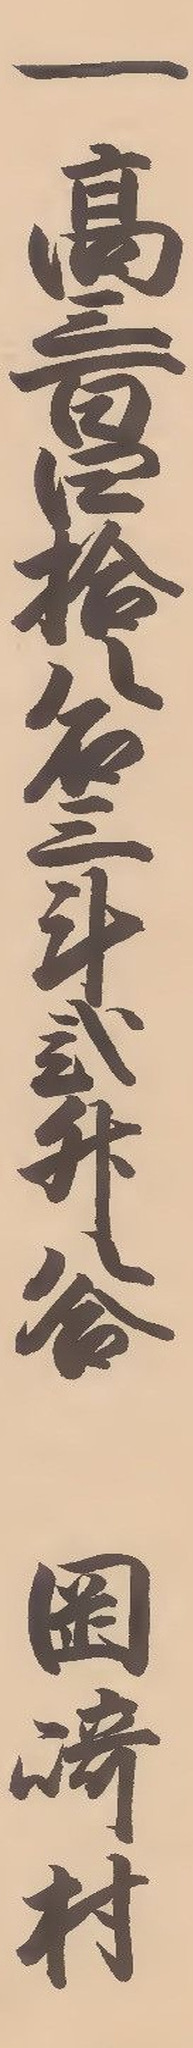一髙三百四拾八石三斗弐升八合岡崎村
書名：豊前国郷帳
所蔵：国立公文書館 National Archives of Japan
